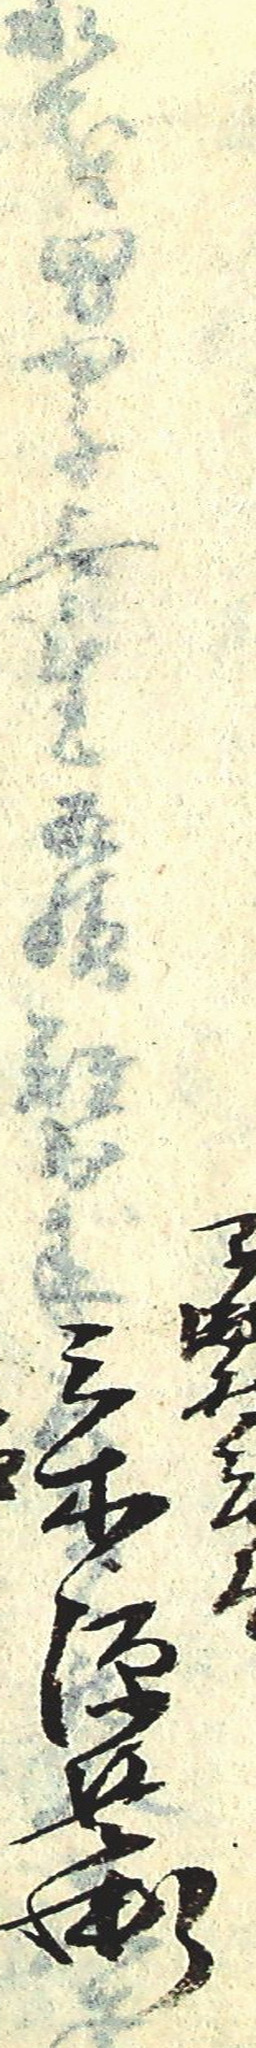三木源兵衛
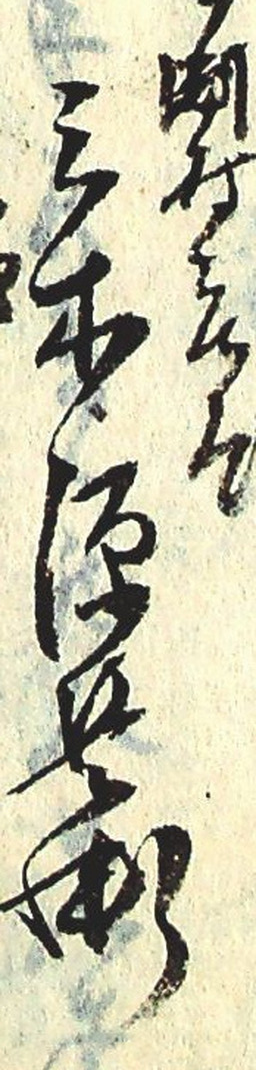三木源兵衛
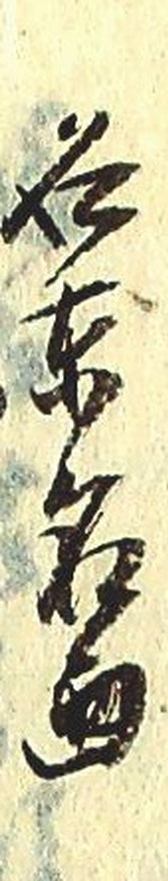名東名西
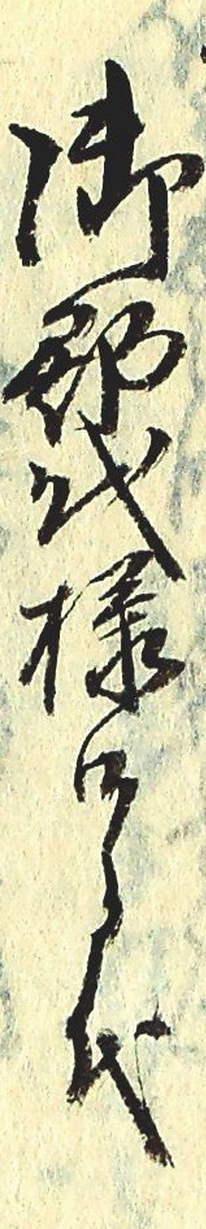御郡代様御手代
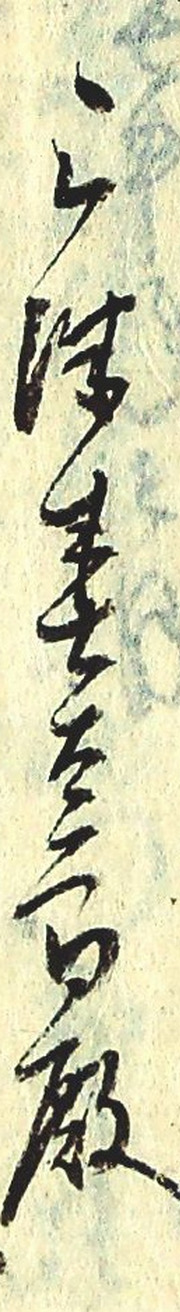三沢春太郎殿
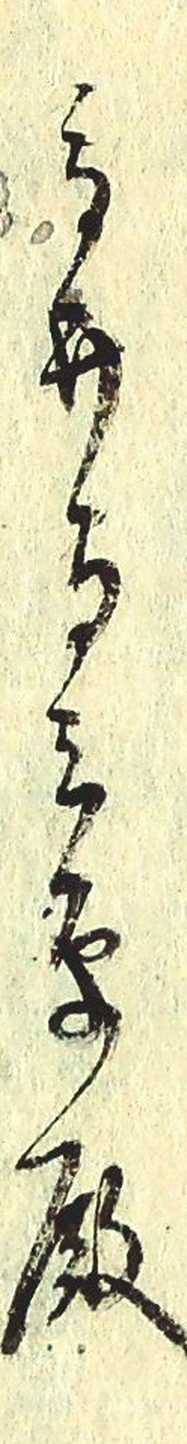高井与三兵衛殿
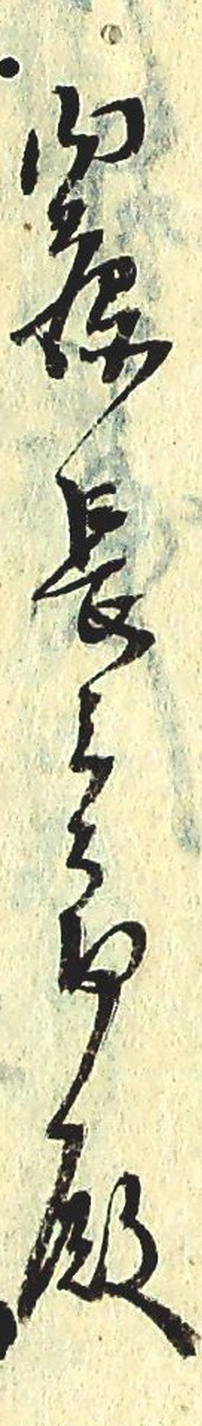内藤長三郎殿
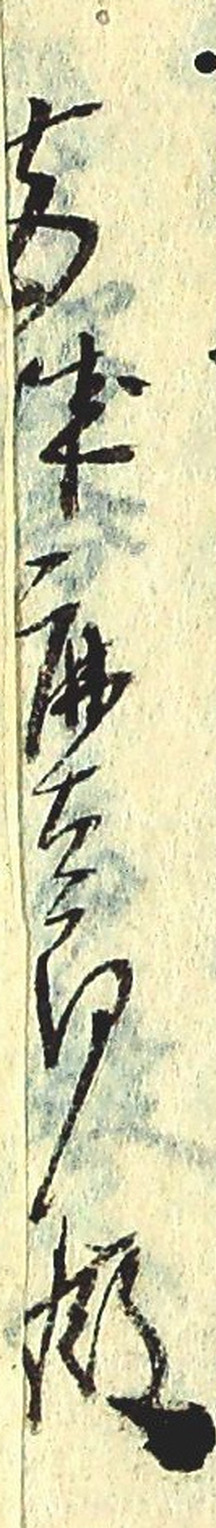宮城麻太郎殿
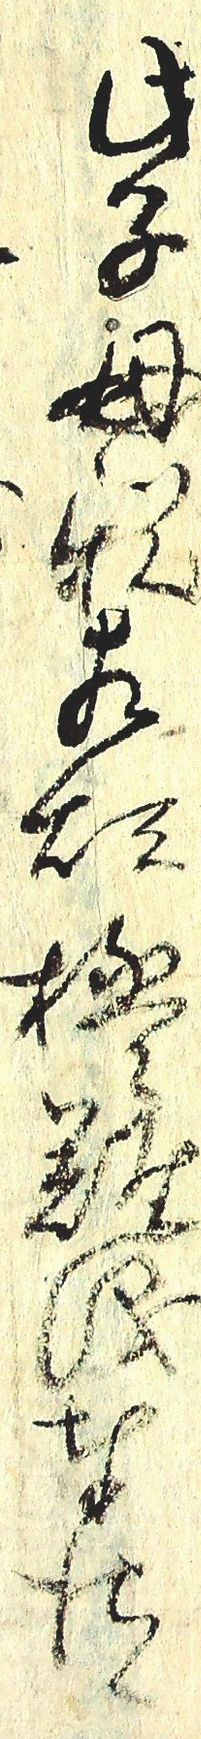此子母親相煩極々難儀奉仕候

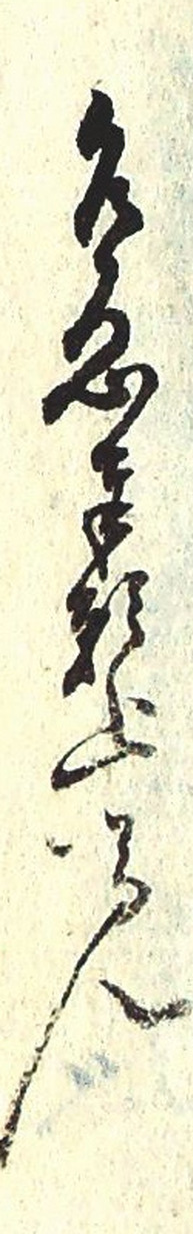乍恐奉願上覚
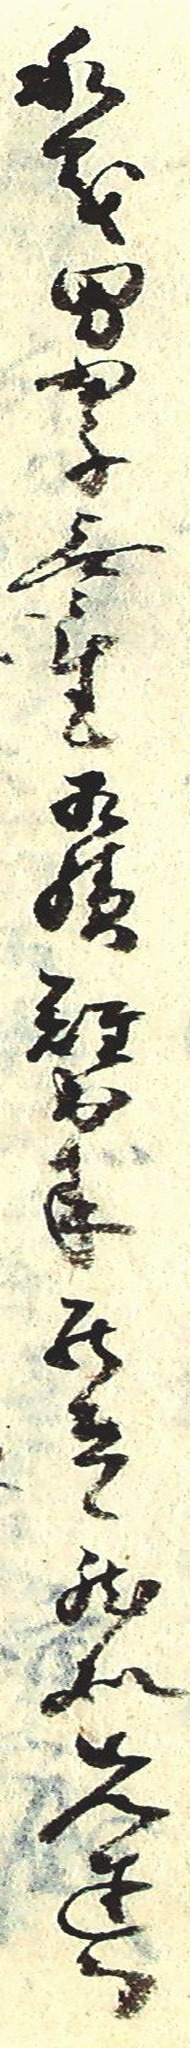私義男女子無御座相続難出来罷在候然処先達て
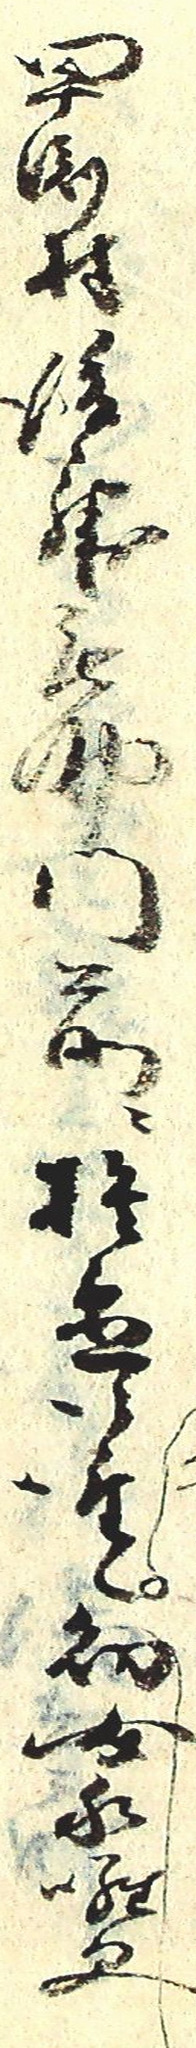早淵村後藤庄助門前に捨置御座候〇幼女私囉受
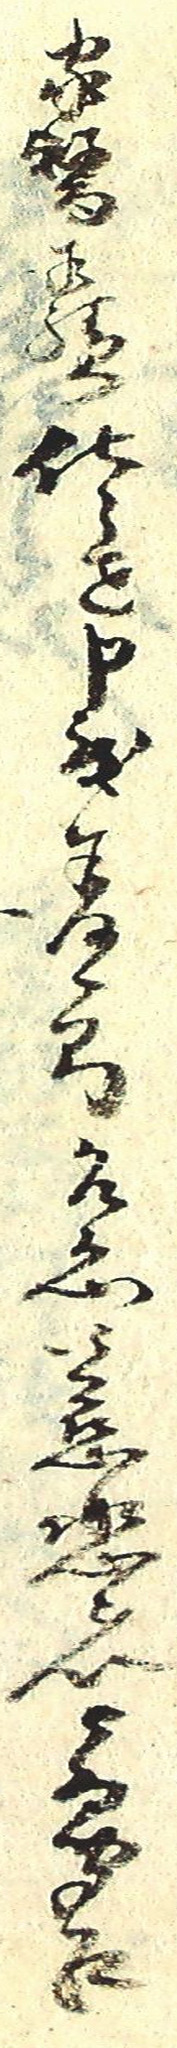家督相続仕らせ申度奉存候間乍恐御慈悲を以被為聞召
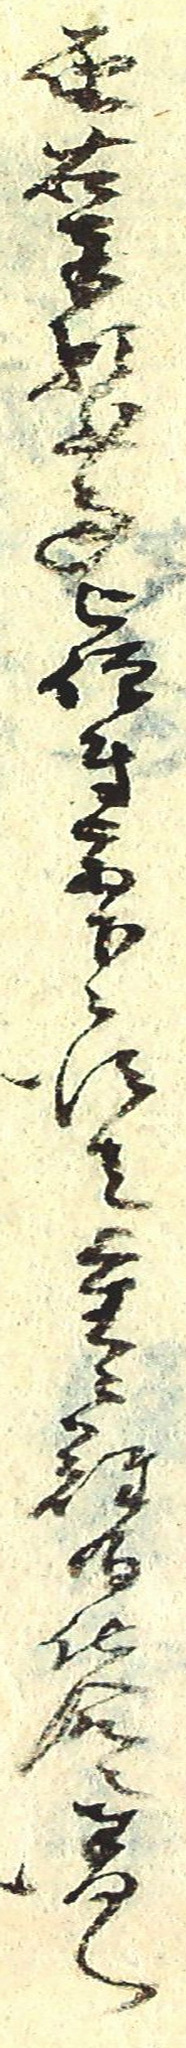届右奉願上通被仰付被為下候得は重々難有仕合に奉存候
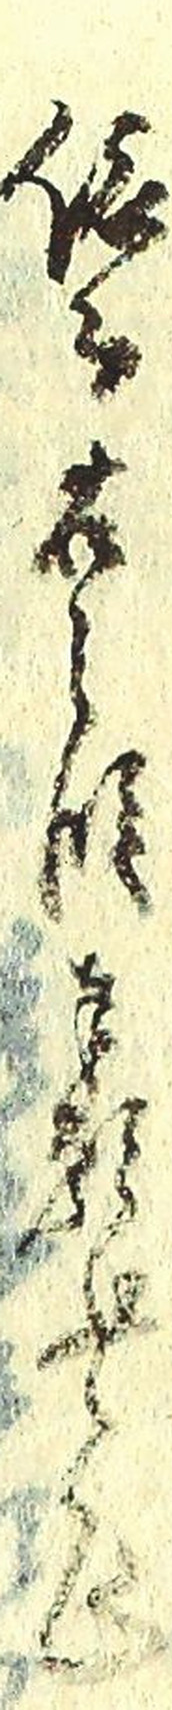依て右之段奉願上候以上
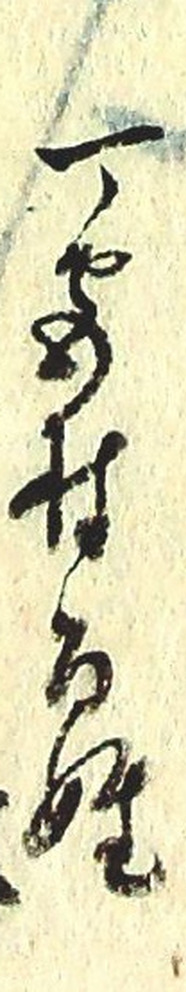一ノ宮村百姓
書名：諸御願書控(弐番）
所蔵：鳴門教育大学 Naruto University of Education
